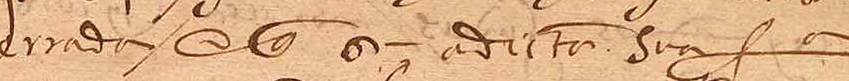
errada / e q̄ se a dicta sua fa
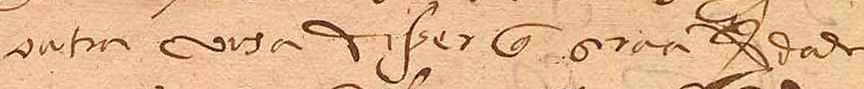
outra cousa disser q̅ seraa ꝟdade
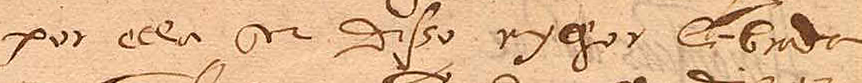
por ella ser disso mylhor lēbrada
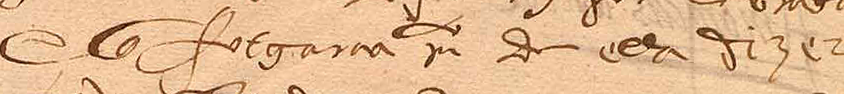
e q̄ folgaraa mto de ella dizer
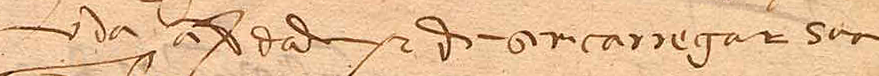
toda a ꝟdade e desemcarregar sua
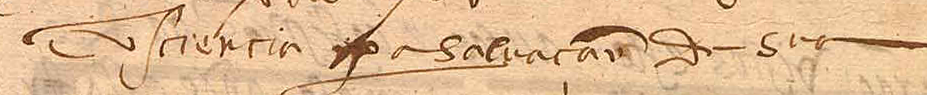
Cōsciencia ꝑa saluação de sua
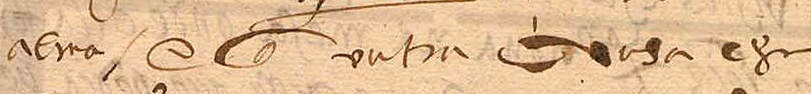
alma / e q̄ outra Cousa lhe
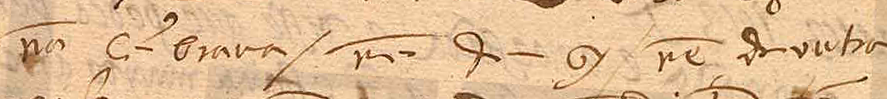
nā lēbraua / n̄e de sy n̄e de outra
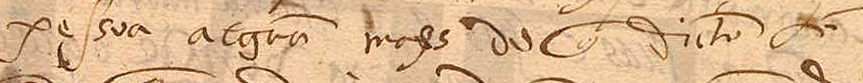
pessoa algūa maes do q̄ dicto tē
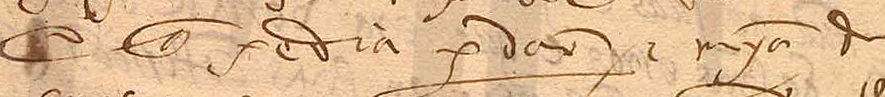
e q̄ pedia ꝑdaõ e mȳa de
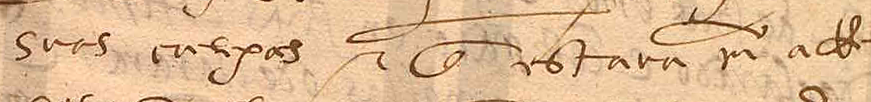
suas culpas e q̄ estaua mto aRe
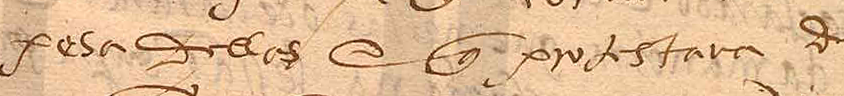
pesa dellas e q̄ protestaua de
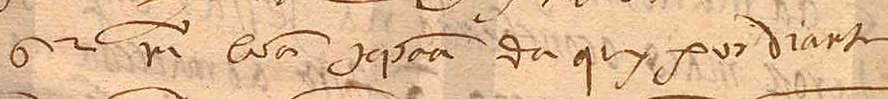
ser mto boā xpāa daquy por diante
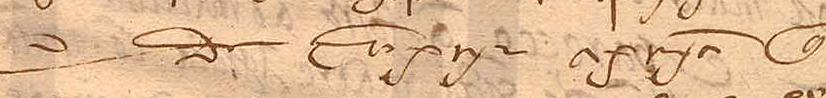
e de cūpryr a pnȳa q̄
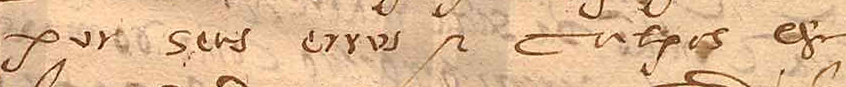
por seus erros e culpas lhe
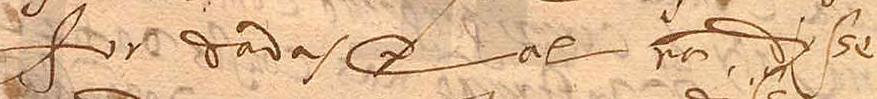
for dada / e al nā disse
